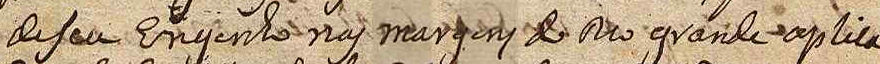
de seu Engenho nas margens do Rio grande aplica
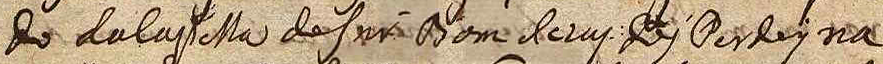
do da Capella de snr̄ Bom Iezus dos Perdois na
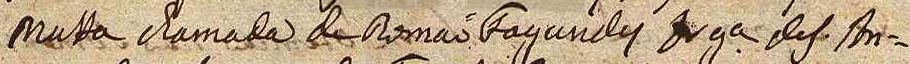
Matta chamada de Romaõ Fagundes frg.a de S. An
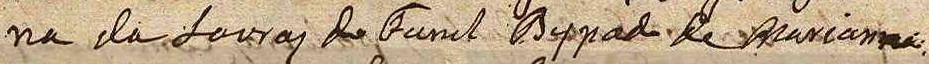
na da Lavras do Funil Bispado de Marianna:
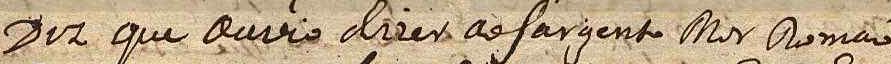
Diz que ouvio dizer ao sargento Mor Romaõ
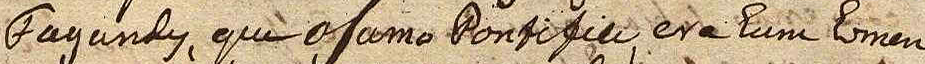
Fagundes, que o sumo Pontifice, era hum homen
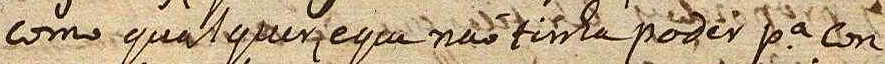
como qualquer, e que naõ tinha poder p.a con
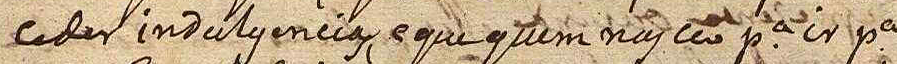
ceder indulgencias, e que quem nasceo p.a ir p.a
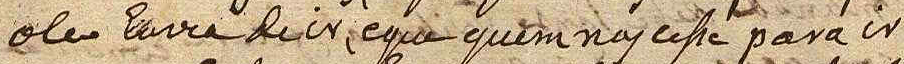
o Ceo havia de ir, e que quem nascesse para ir
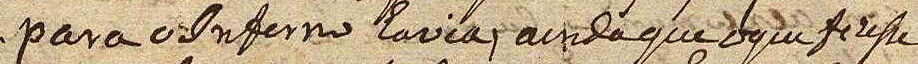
para o Inferno havia, ainda que o que fezesse
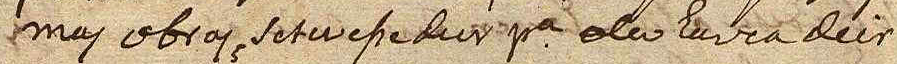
mas obras, se tevesse de ir p.a o Ceo havia de ir
